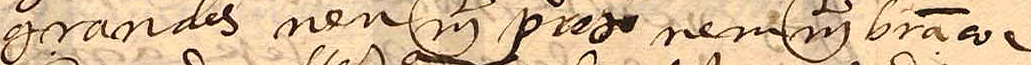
grandes nen mto preto nem mto brāco e
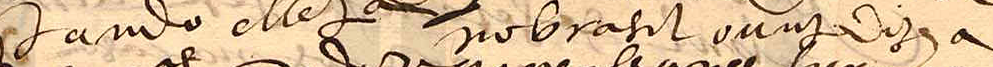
Estando elle ta no brasil ouujo dizer a
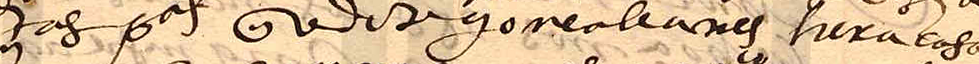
mtas pas q̄ o dito goncaleanes hera casa
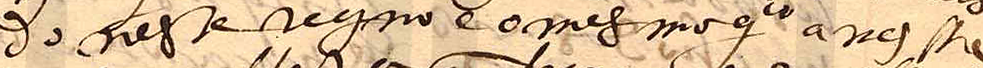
do neste regno e o mesmo gco anes lhe
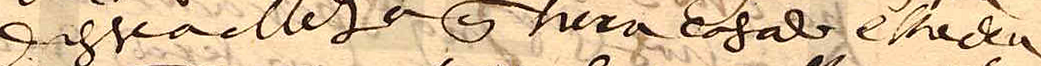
disse a elle ta q̄ hera casado e lhe deu
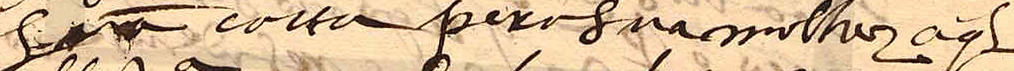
huā carta pera sua molher a q̄L
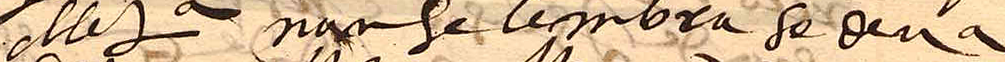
elle ta nan se lembra se deu a
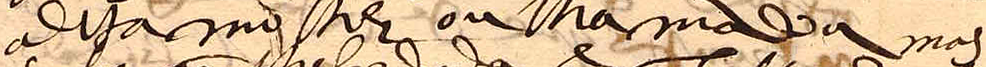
a dita molher ou lha mādou mas
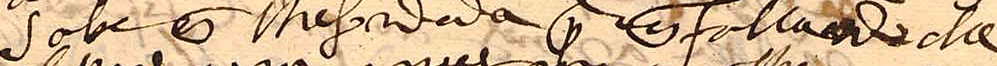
Sabe q̄ lhe foi dada p̄o q̄ fallando elle
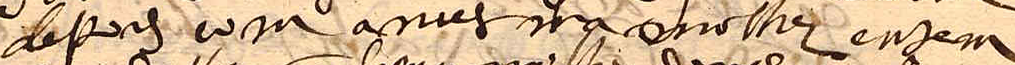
depois com a mesma molher entem
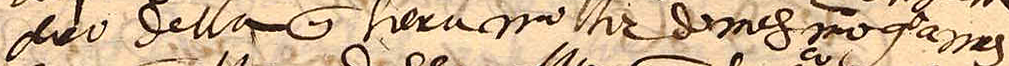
deo della q̄ hera molher do mesmo go anes
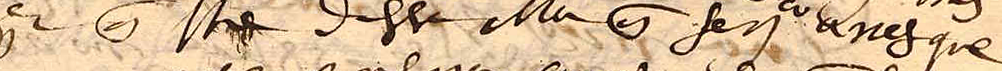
p̄o q̄ lhe disse ella q̄ se gco anes que
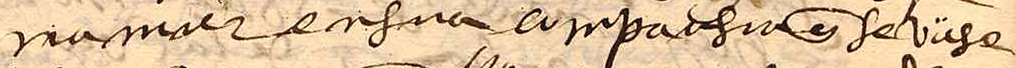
ria maes en sua companhia q̄ se viese
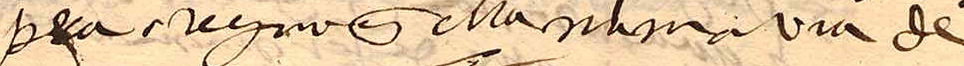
pera o Regno q̄ ella nam avia de
